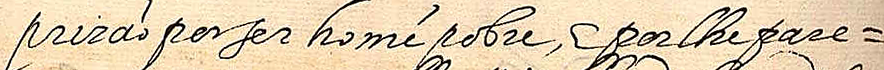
prizão por ser home̅ pobre, E por lhe pare
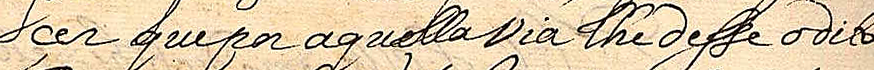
çer que por aquella via lhe desse o dito
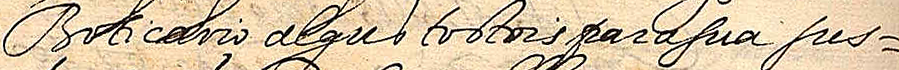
Boticario algus̅ tostois para sua sus
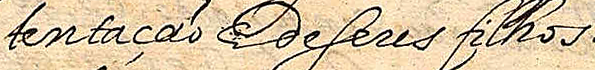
tentação E de seus filhos.
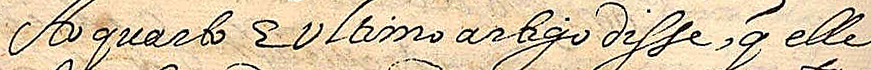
Ao quarto E ultimo artigo disse, q̅ elle
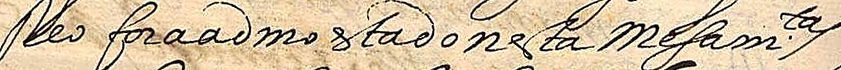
Reo fora admostado nesta mesa m.tas
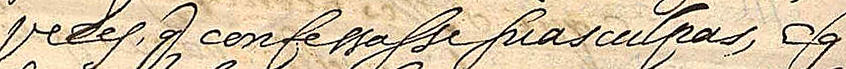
vezes, q̅ confessasse suas culpas, E q̅
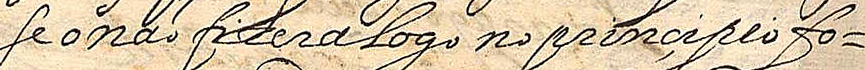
se o não fizera Logo no prinçipio fo
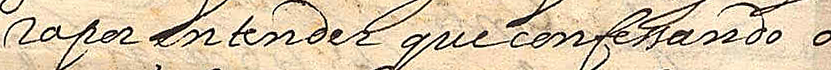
ra por entender que confessando o
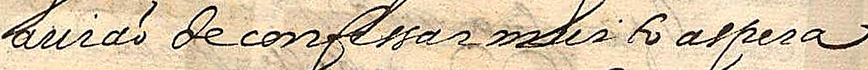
auião de confessar muito aspera
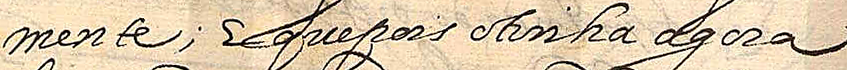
mente; E que pois o tinha agora
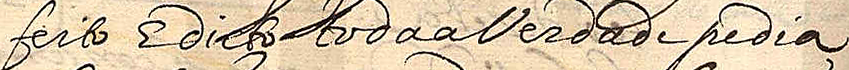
feito E dicto toda a Verdade pedia
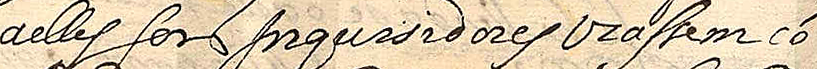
a elles sors̅ Jnquisidores vzassem co̅
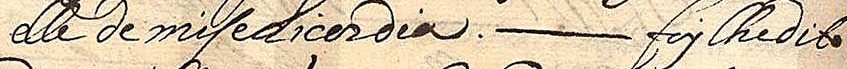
elle de misericordia. foy lhe dito
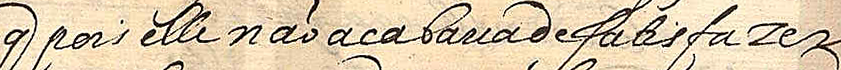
q̅ pois elle não acabaua de satisfazer
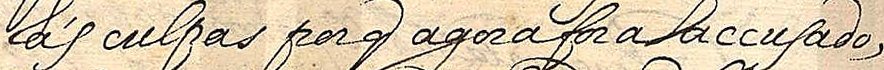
ás culpas porq̅ agora fora accusado,
